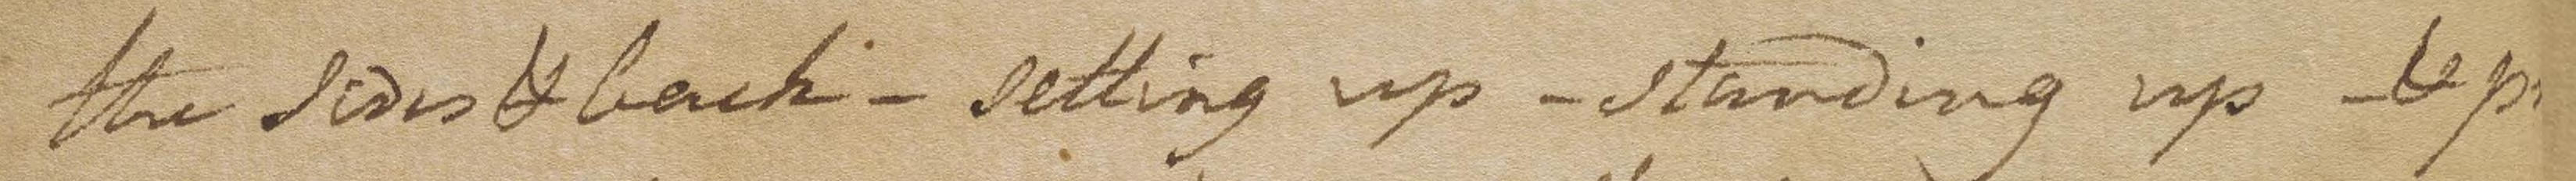the sides & back, setting up, standing up, & p
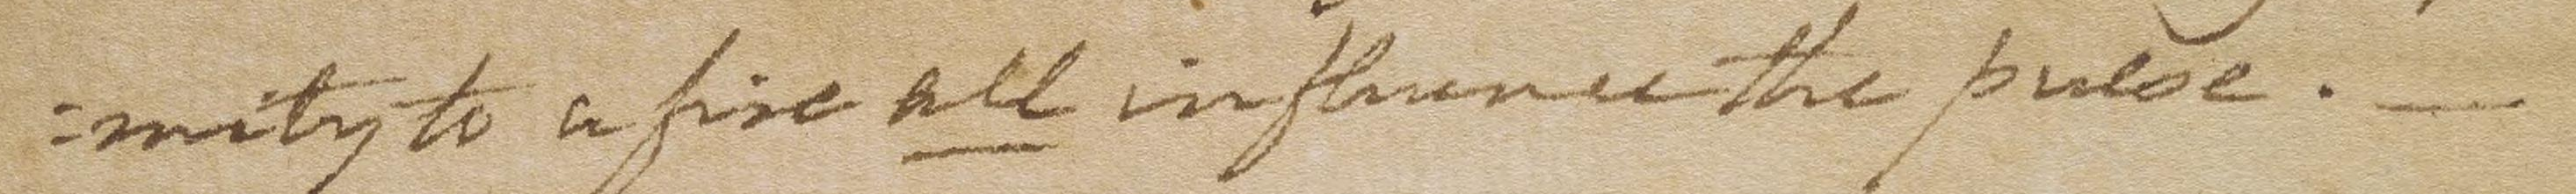-mity to a fire all influence the pulse.
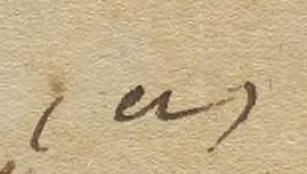(a)
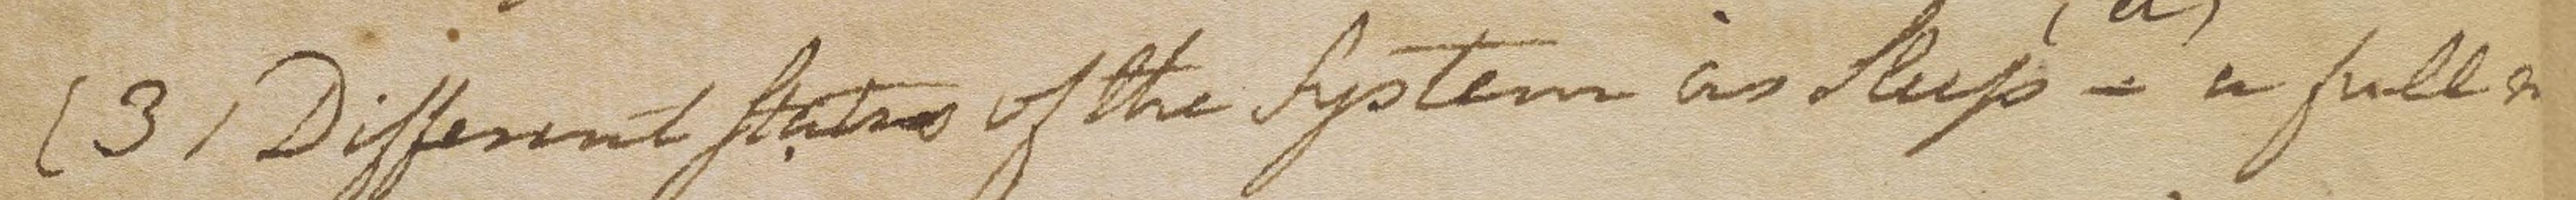(3) Different States of the System as Sleep, a full [__]
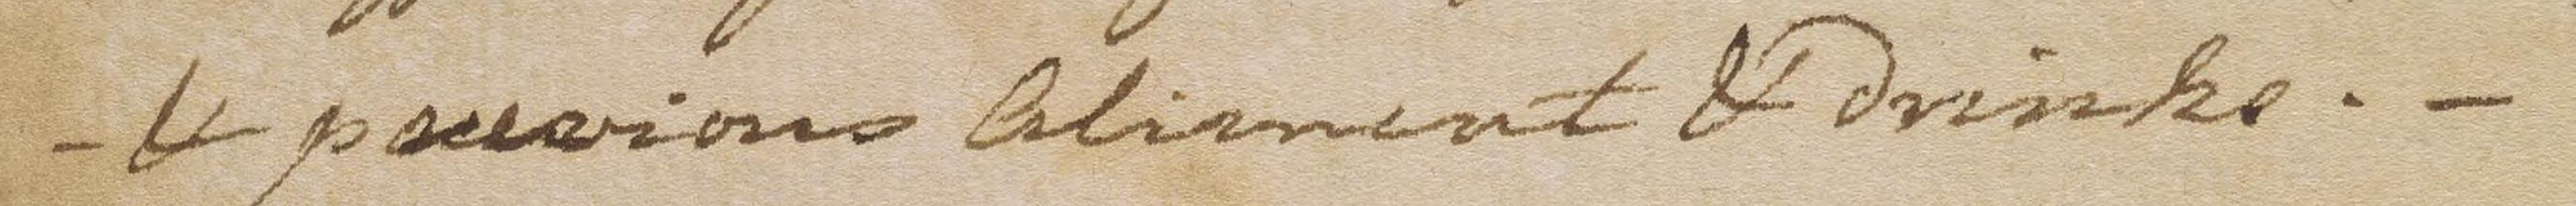& provisions Aliment & drinks.-
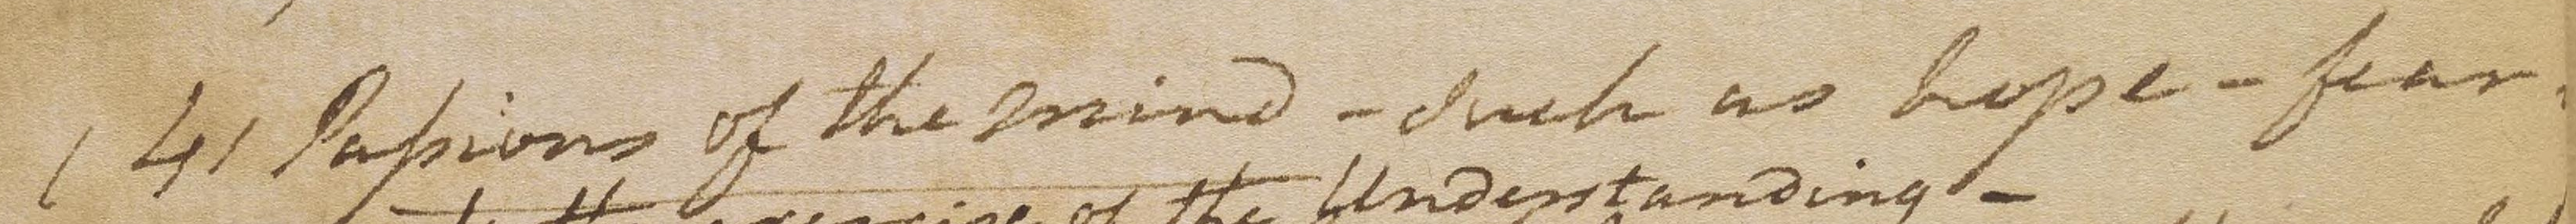(4) Passions of the mind- such as hope- fear
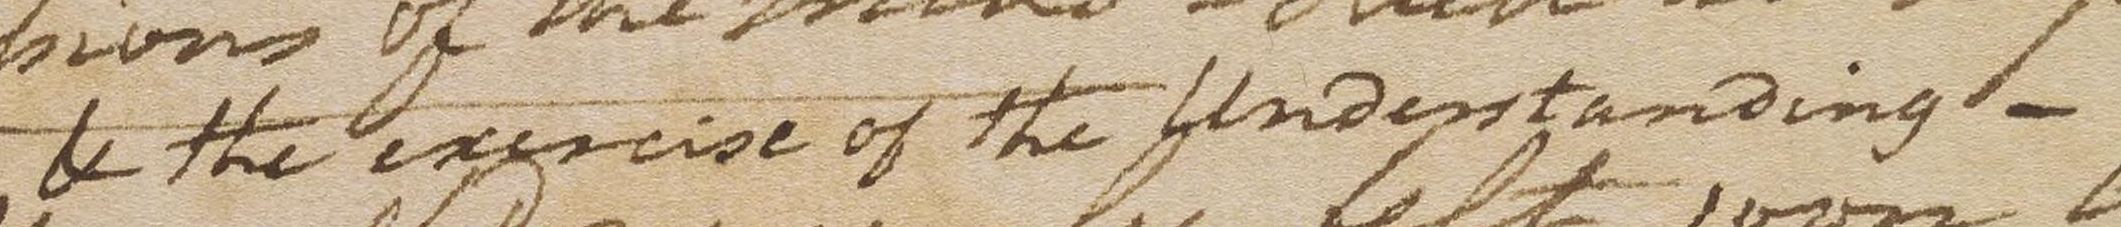& the exercise of understanding
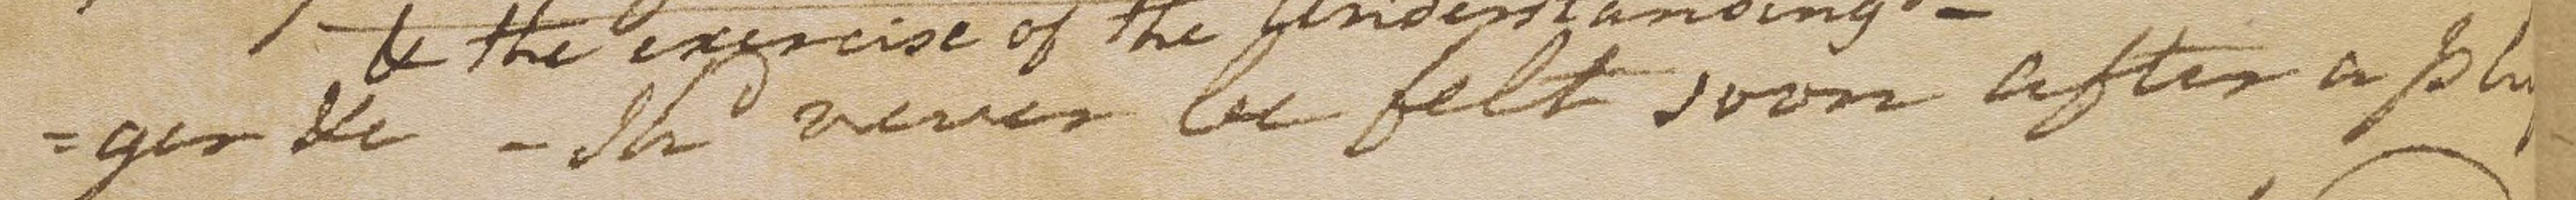-ger &c. It never be feelt soon after physi-
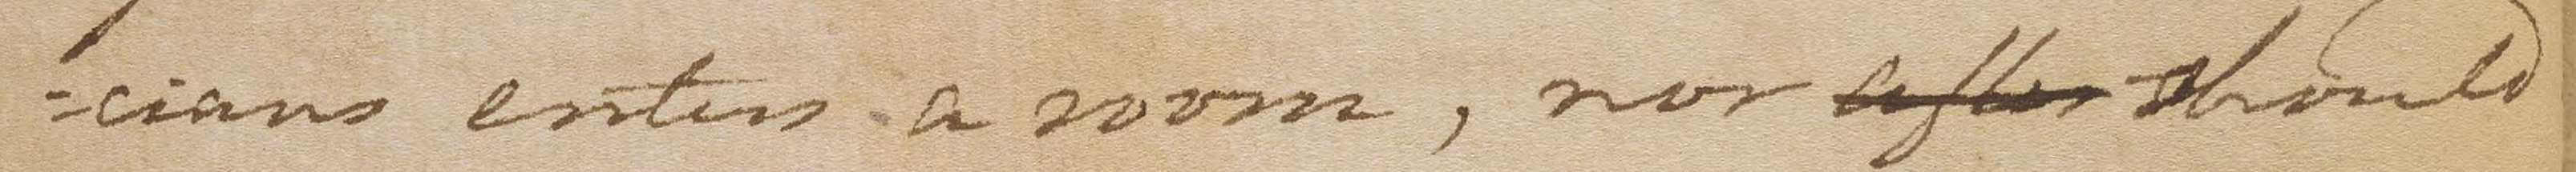-cians enters a room, nor [after] should
